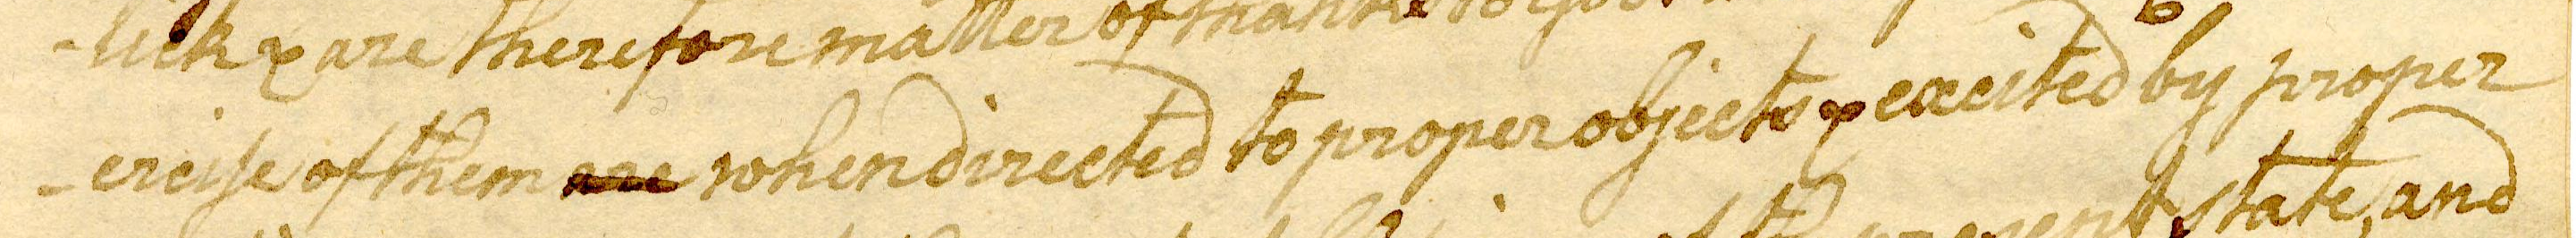-ercise of them [are] when directed to proper objects & excited by proper
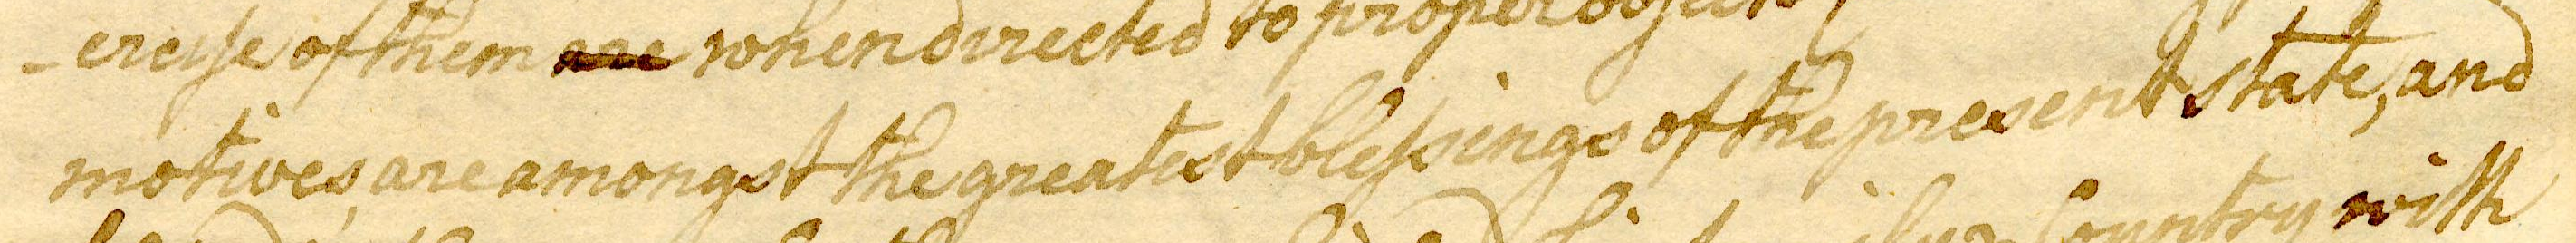motives are amongst the greatest blessings of the present state, and
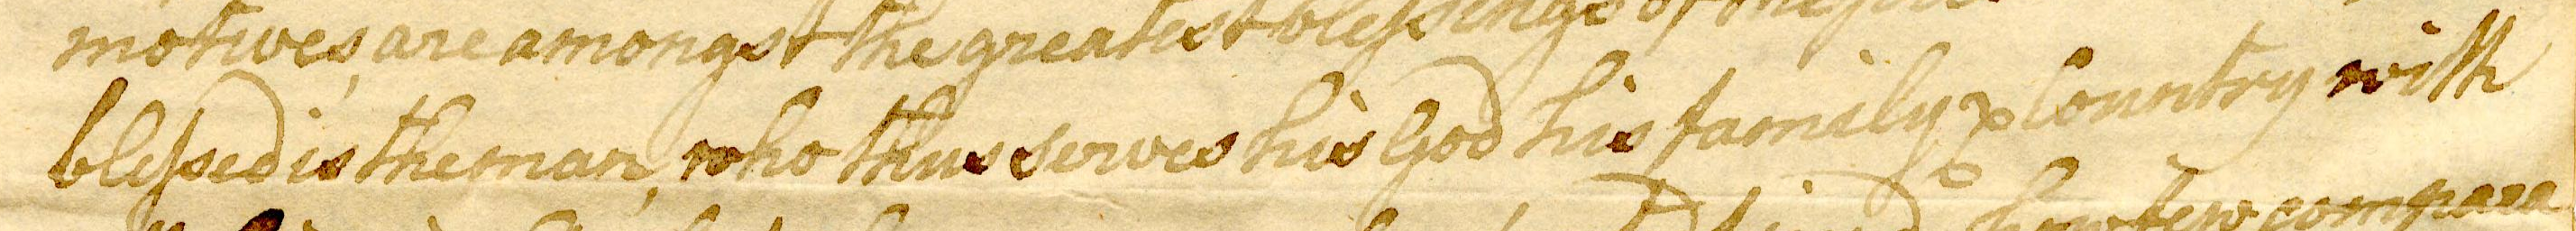blessed is the man, who thus serves his God his family & Country with
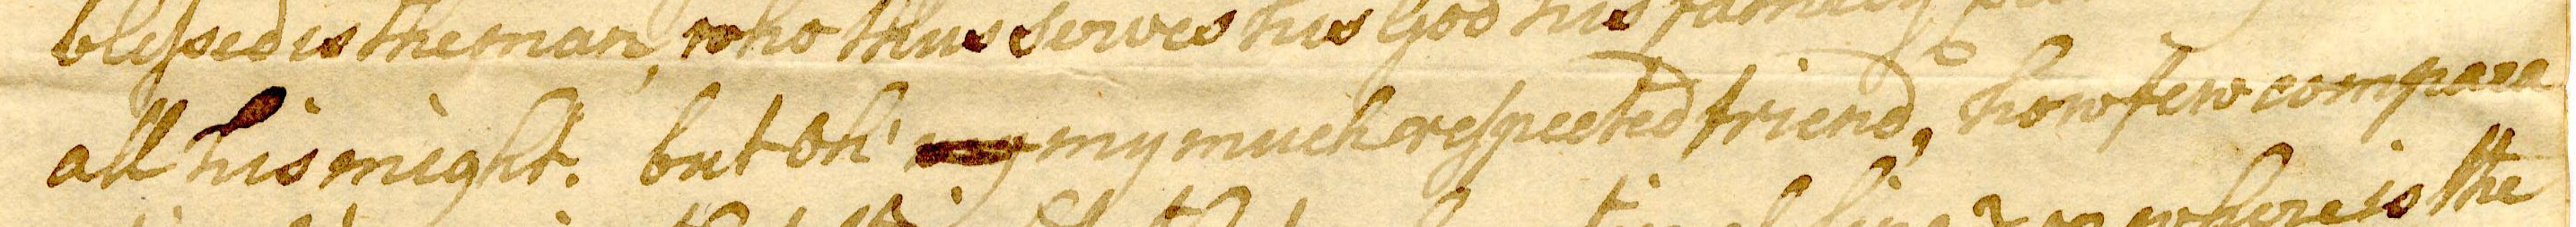all his might. but Oh! [my] my much respected friend, now few compara
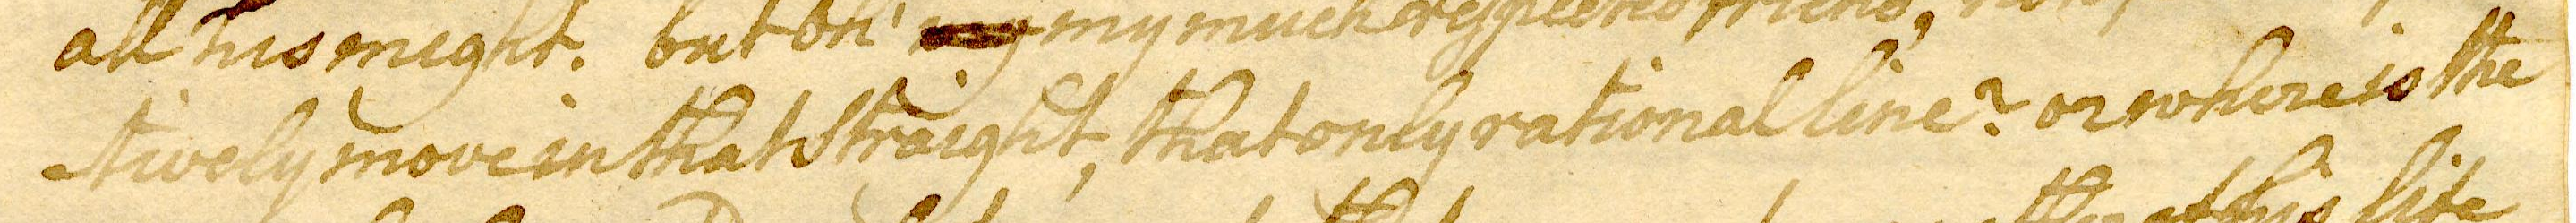-tively move in that Straight, that only rational line? or where is the
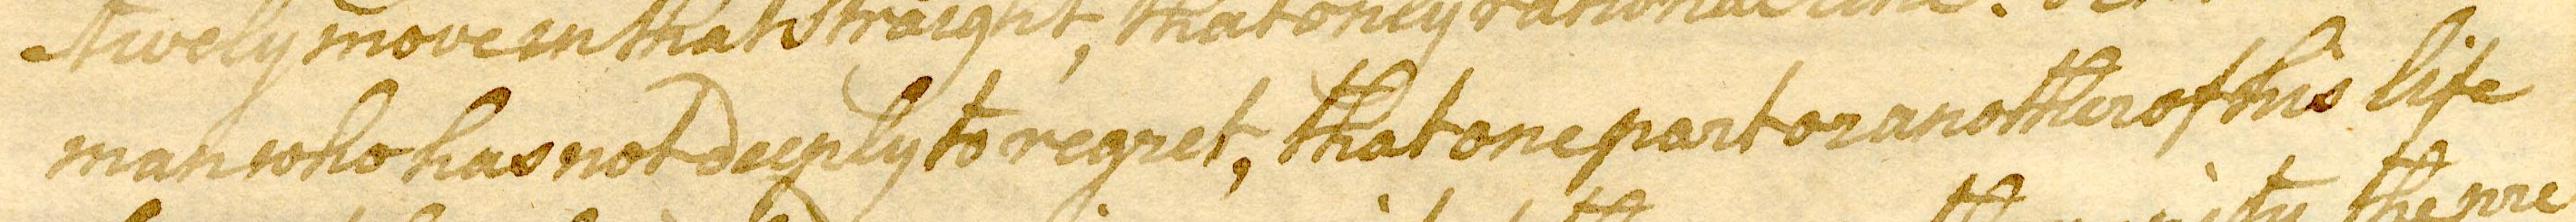man who has not deeply to regret, that one part or another of his life
